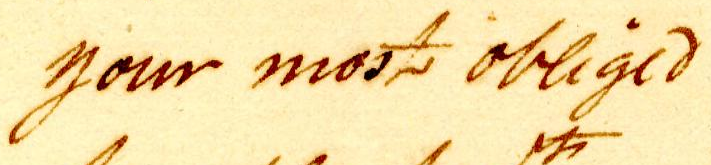your most obliged
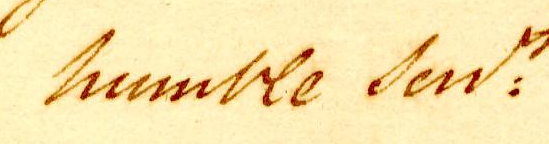humble Serv^t
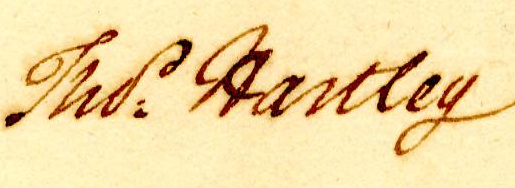Tho^s. Hartley
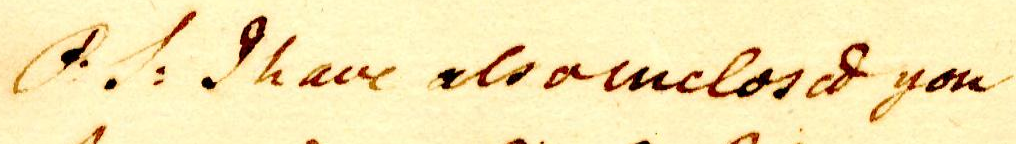P.S. I have also inclosed you
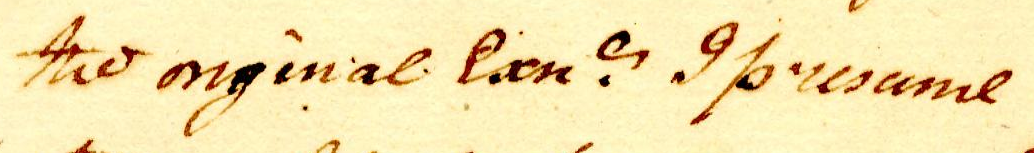the original Exn^e. I presume
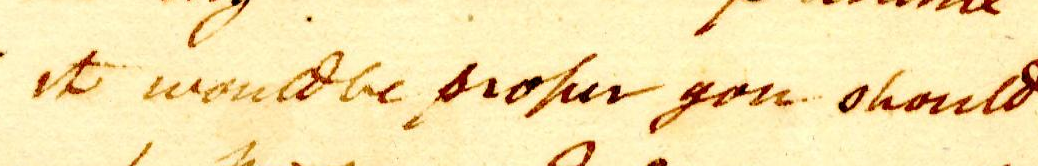it would be proper you should
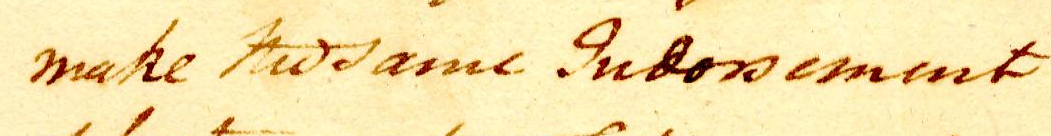make the same Indorsement
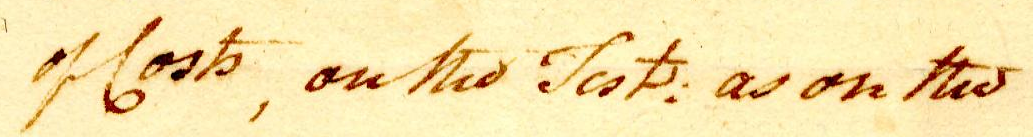of Costs, on the Test as on the
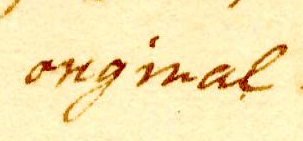original
